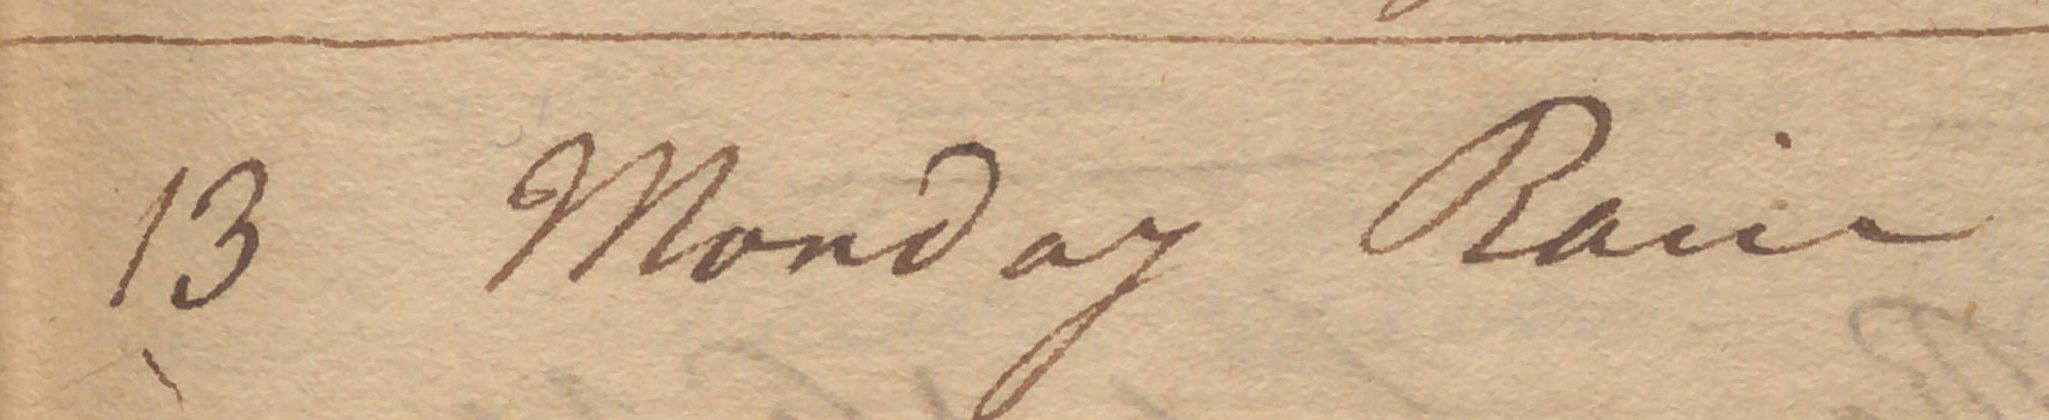13 Monday Rain
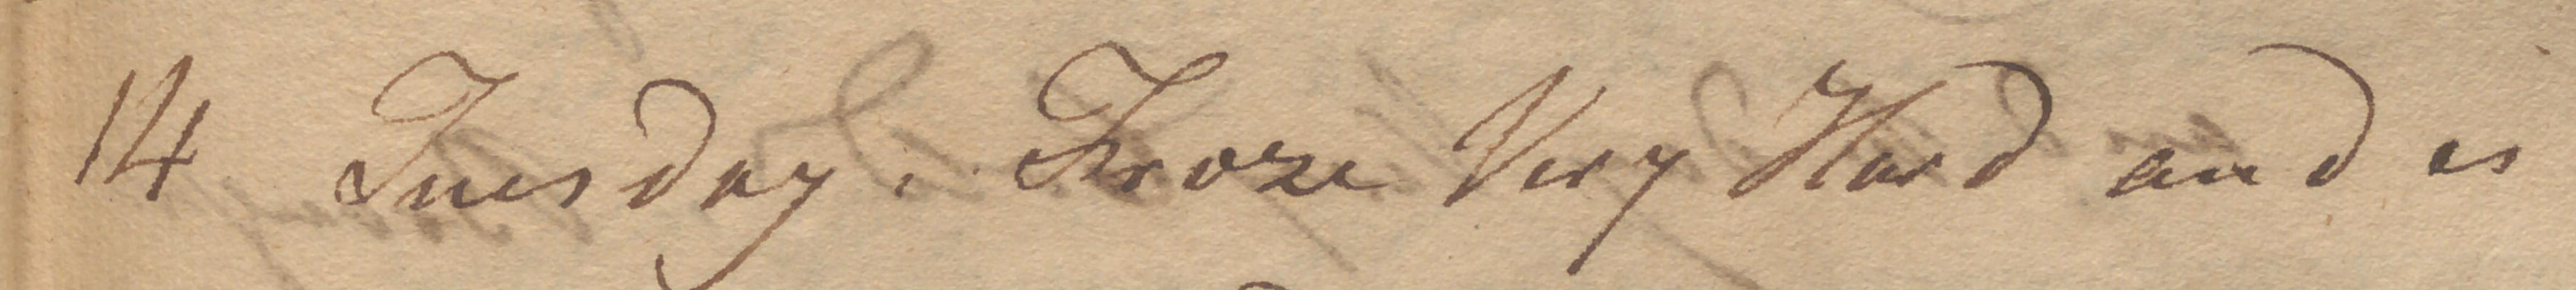14 Tuesday. Froze Very Hard and is
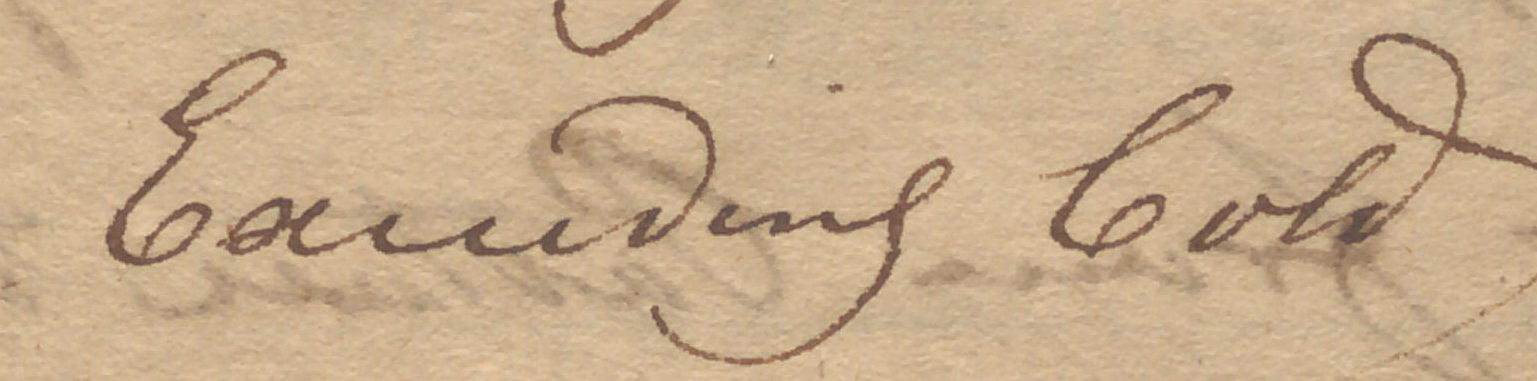Exceeding Cold
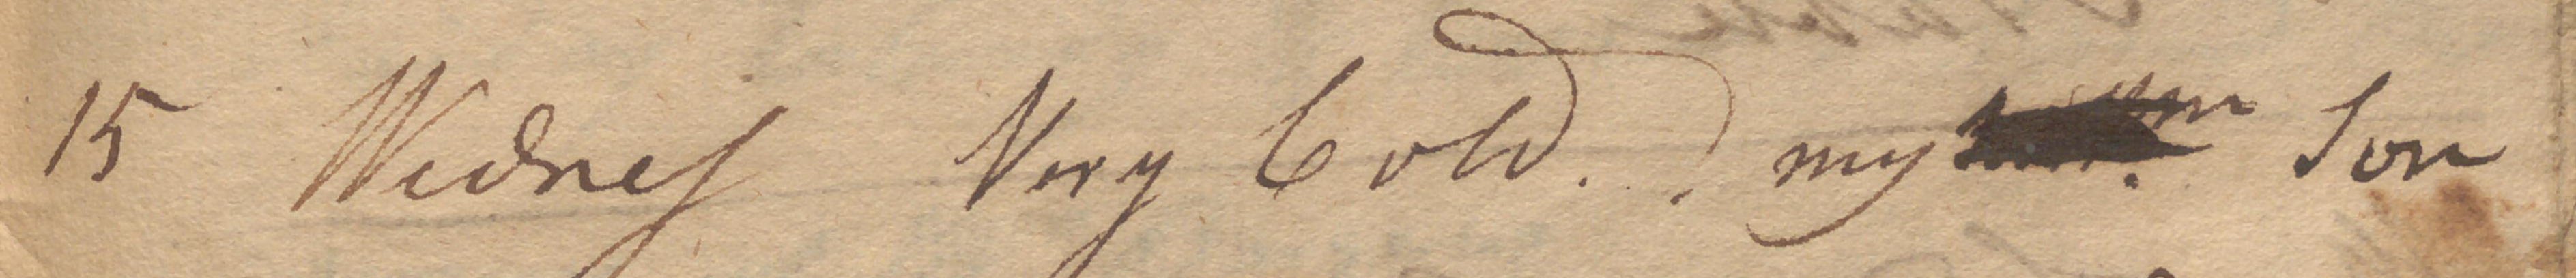15 Wednes Very Cold. my [____] Son
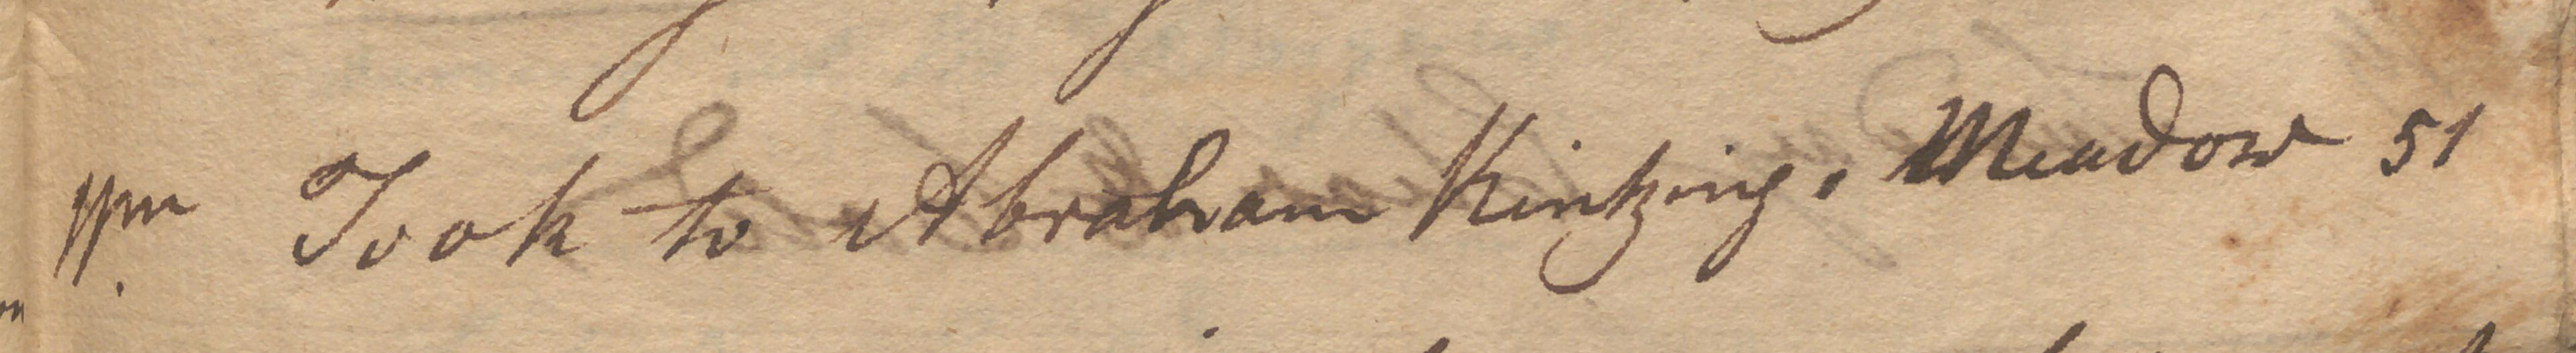W^m. Took to Abraham Kintzings Meadow 51
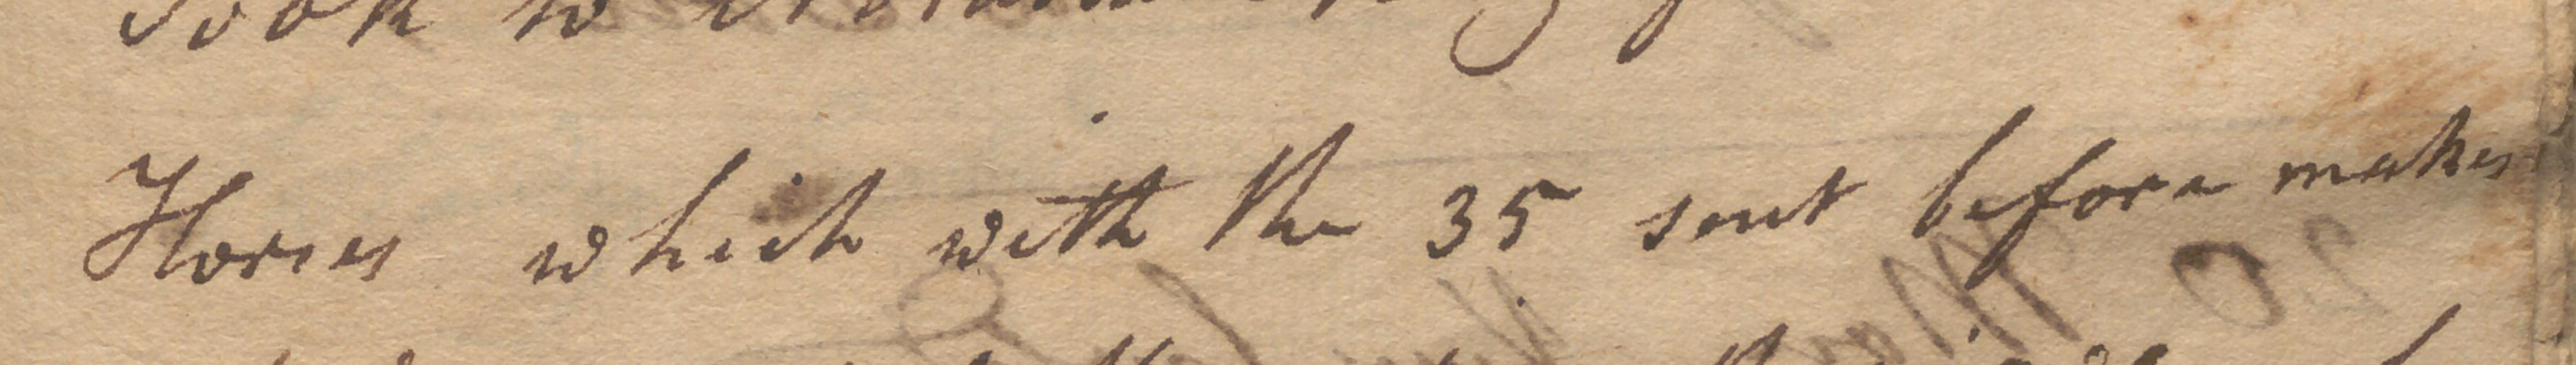Horses which with the 35 sent before makes
